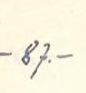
87
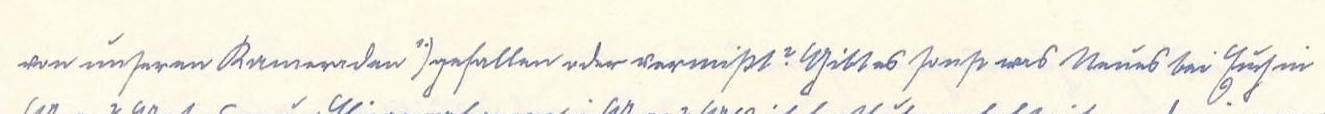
von unseren Kameraden 1) gefallen oder vermißt? Gibt es sonst was Neues bei Euch in
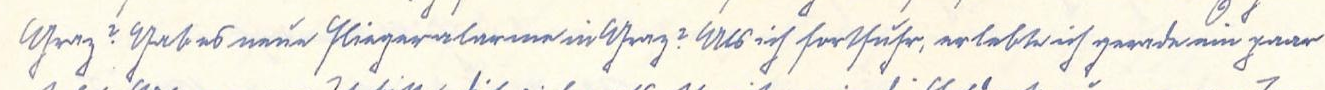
Graz? Gab es neue Fliegeralarme in Graz? Als ich fortfuhr, erlebte ich gerade ein paar
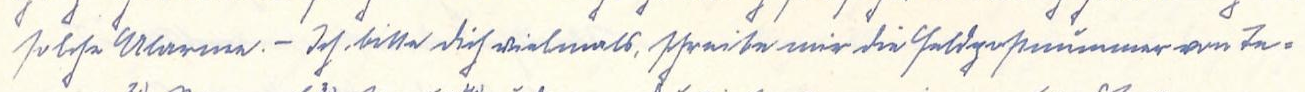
solche Alarme.- Ich bitte dich vielmals, schreibe mir die Feldpostnummer von Te-
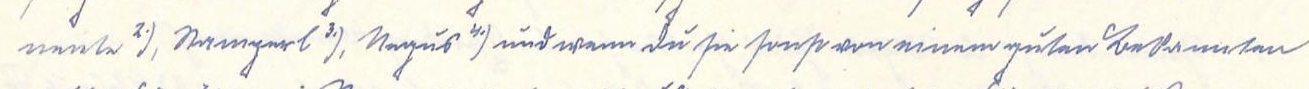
nente 2), Stamperl 4), Negus 14 und wenn du sie sonst von einem guten Bekannten
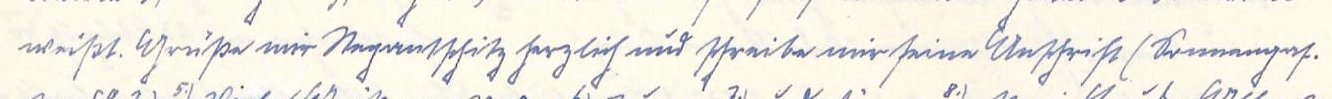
weißt. Grüße mir Stegantschitz herzlich und schreibe mir seine Anschrift (Sonnengas-
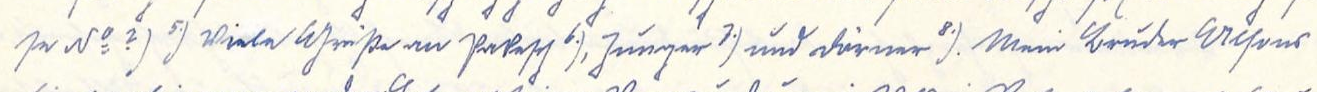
se No ?) 1) viele Größe an Pakesch 6), Junger 7) und Dorner ). Mein Bruder Alfons
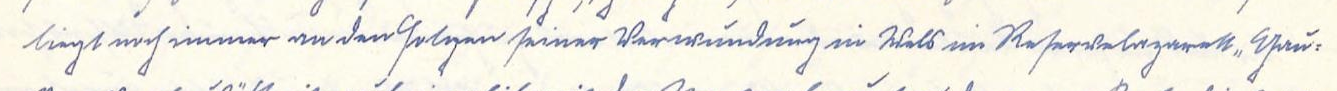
liegt noch immer an den Folgen seiner Verwundung in Wels im Reservelazarett ,„Gau-
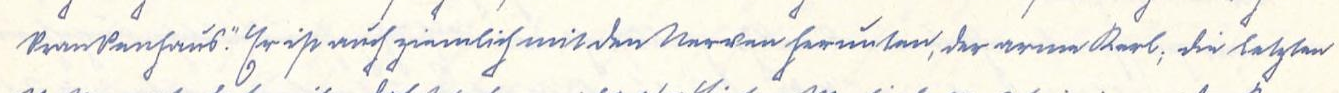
krankenhaus. Er ist auch ziemlich mit den Nerven herunten, der arme Kerl, die letzten
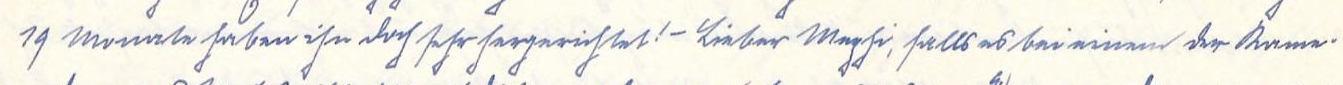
19 Monate haben ihn doch sehr hergerichtet! - Lieber Mephi, falls es bei einem der Kame-
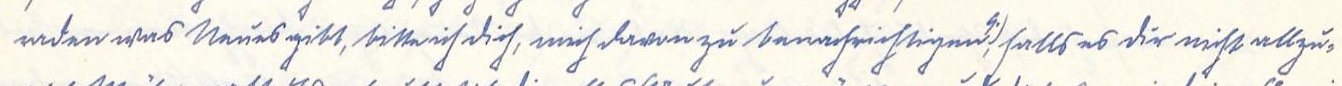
raden was Neues gibt, bitte ich dich mich davon zu benachrichtigen 9), falls es dir nicht allzu-
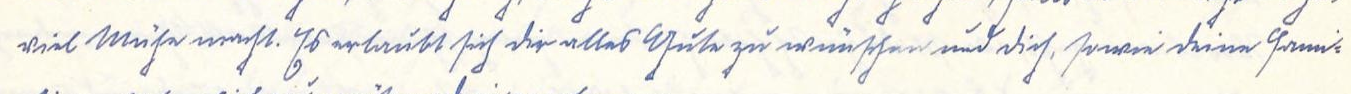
viel Mühe macht. Es erlaubt sich dir alles Gute zu wünschen und dich, sowie deine Fami-
